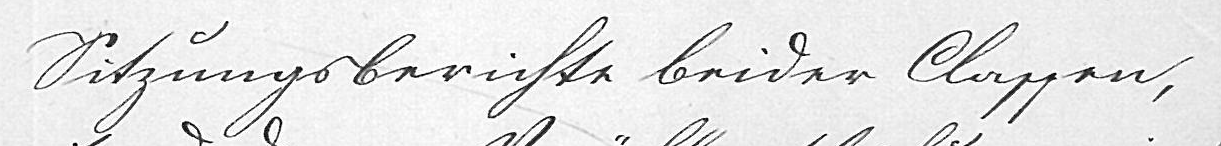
Sitzungsberichte beider Classen,
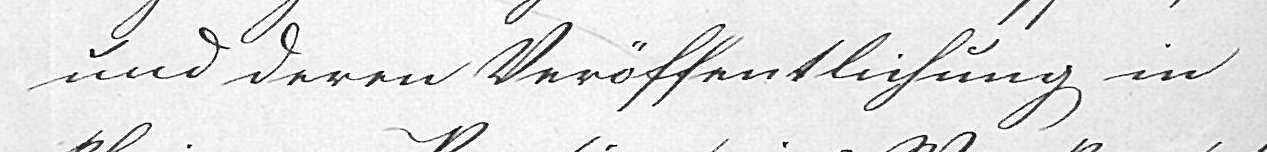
und deren Veröffentlichung in
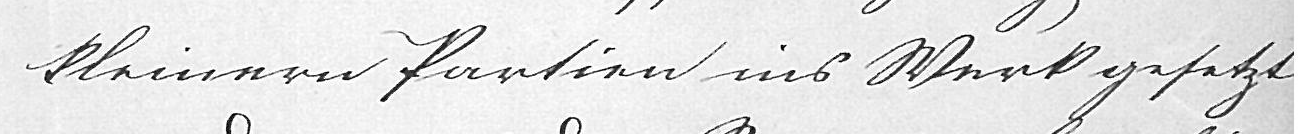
kleinern Partien in Werk gesetzt
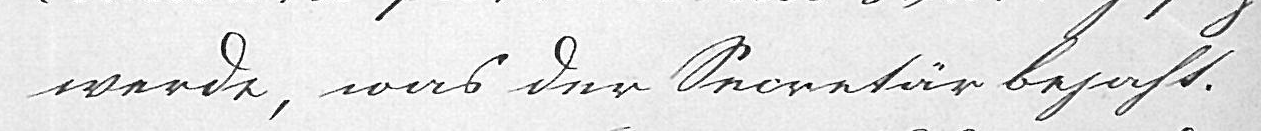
werde, was der Secretär bejaht.
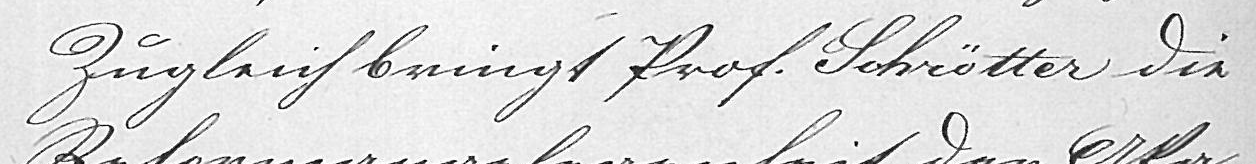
Zugleich bringt Prof. Schrötter die
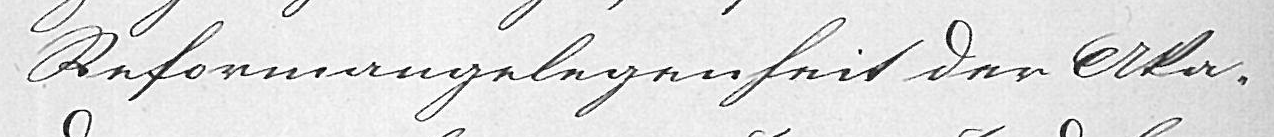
Reformangelegenheit der Aka-
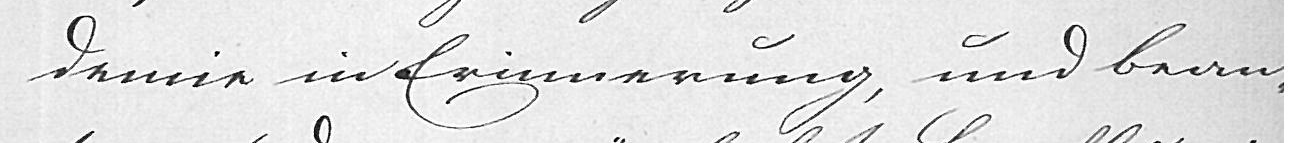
demie in Erinnerung, und bean-
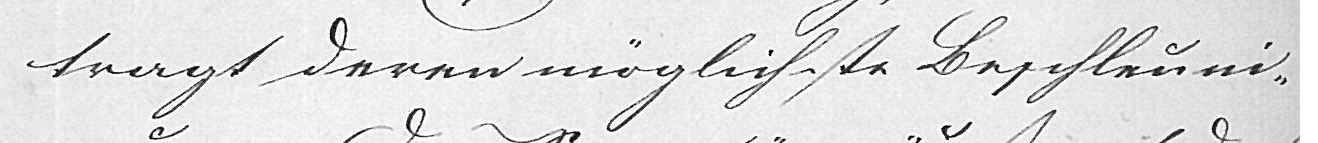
tragt deren möglichste Beschleuni-
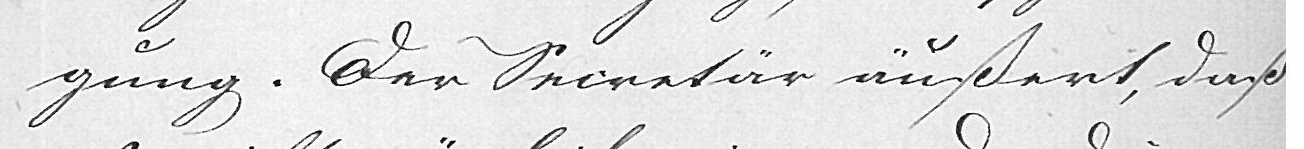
gung. Der Secretär äußert, daß
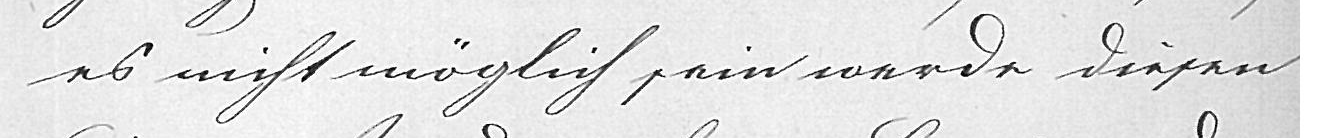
es nicht möglich sein werde diesen
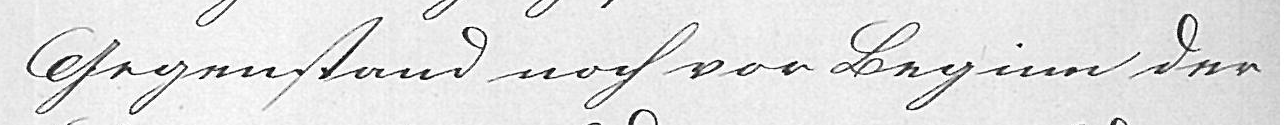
Gegenstand noch vor Beginn der
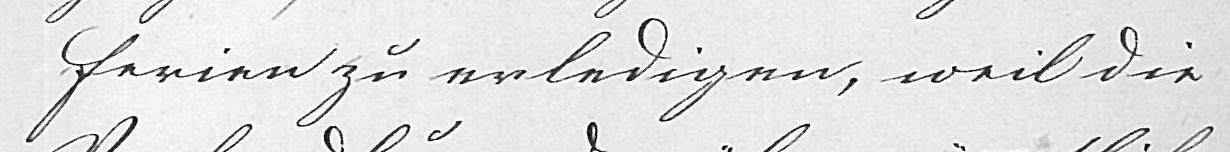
Ferien zu erledigen, weil die
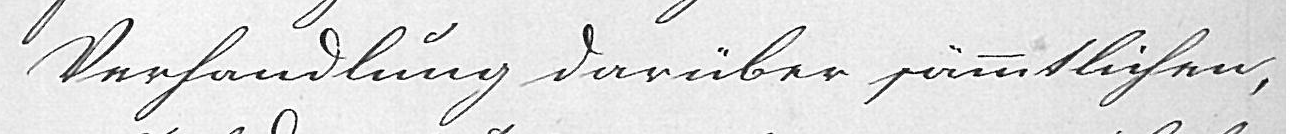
Verhandlung darüber sämmtlichen,
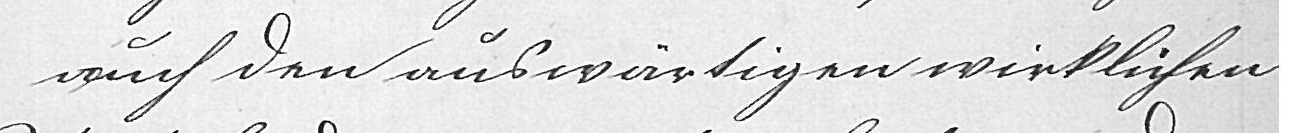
auch den auswärtigen wirklichen
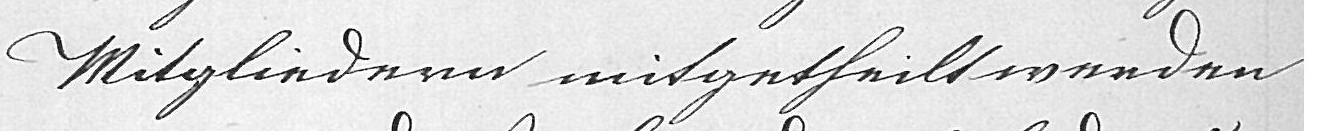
Mitgliedern mitgetheilt werden
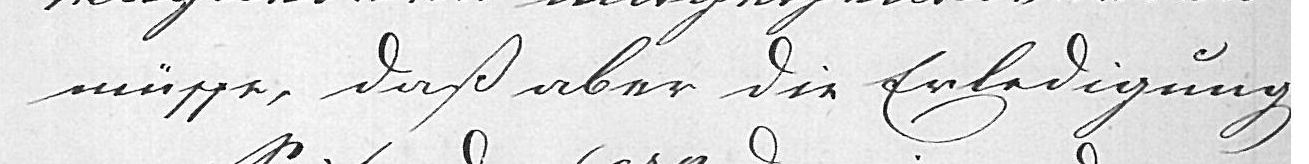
müsse, daß aber die Erledigung
